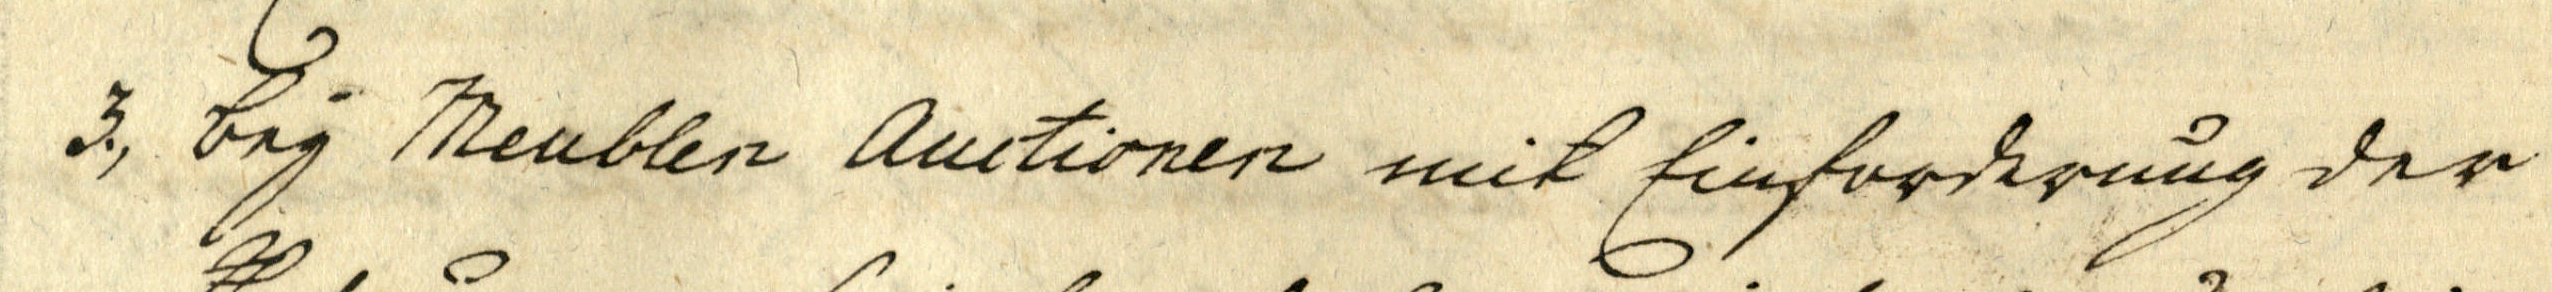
3., Bey Meublen Auctionen mit Einforderung der
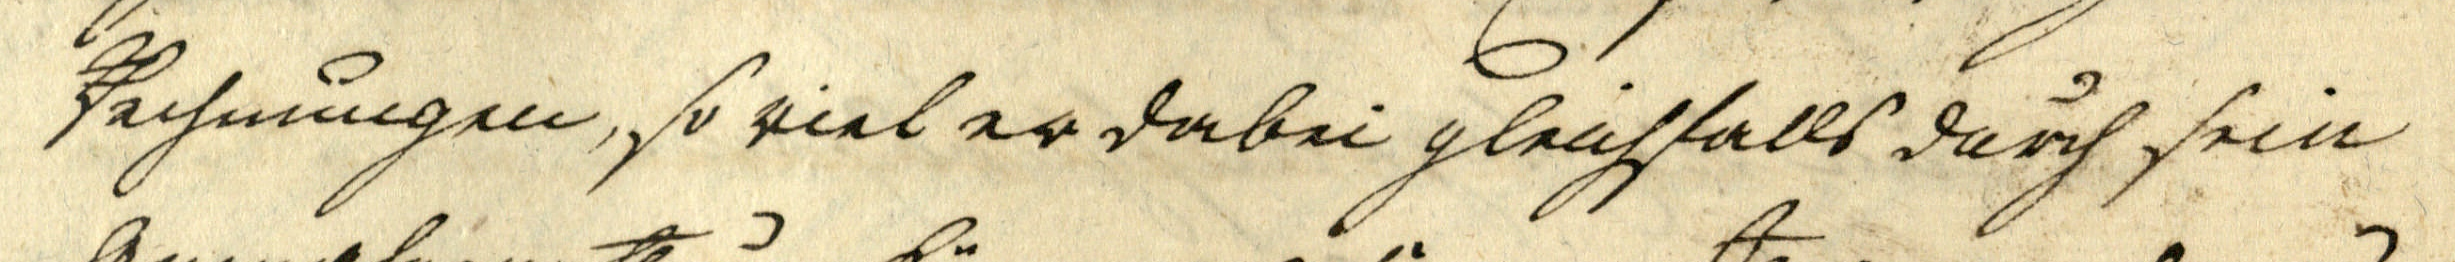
Rechnungen, so viel er dabei gleichfalls durch sein
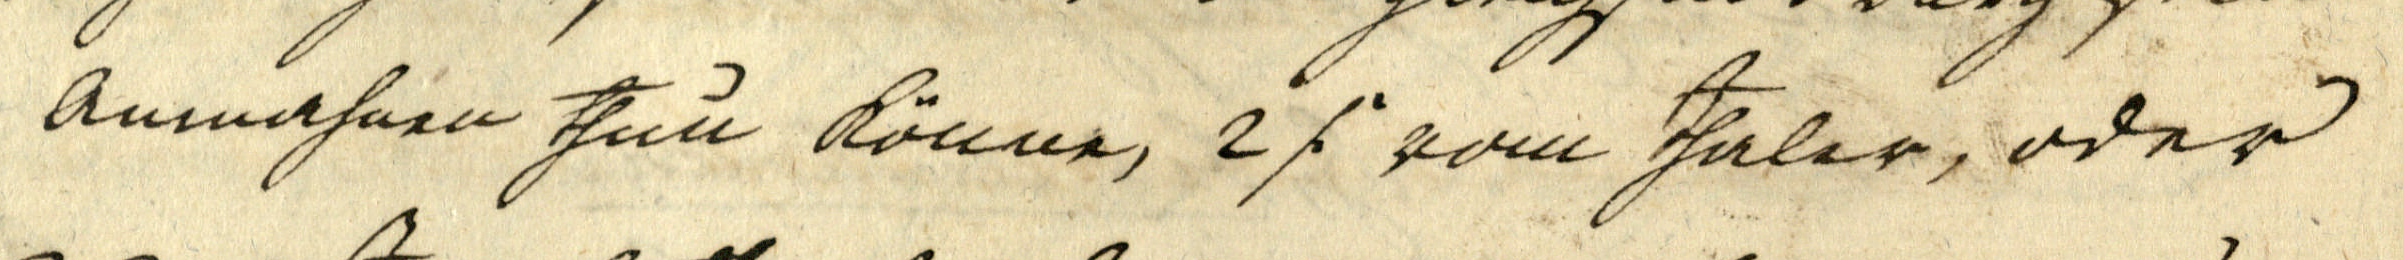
Anmahnen thun könne, 2 s. vom Thaler, oder
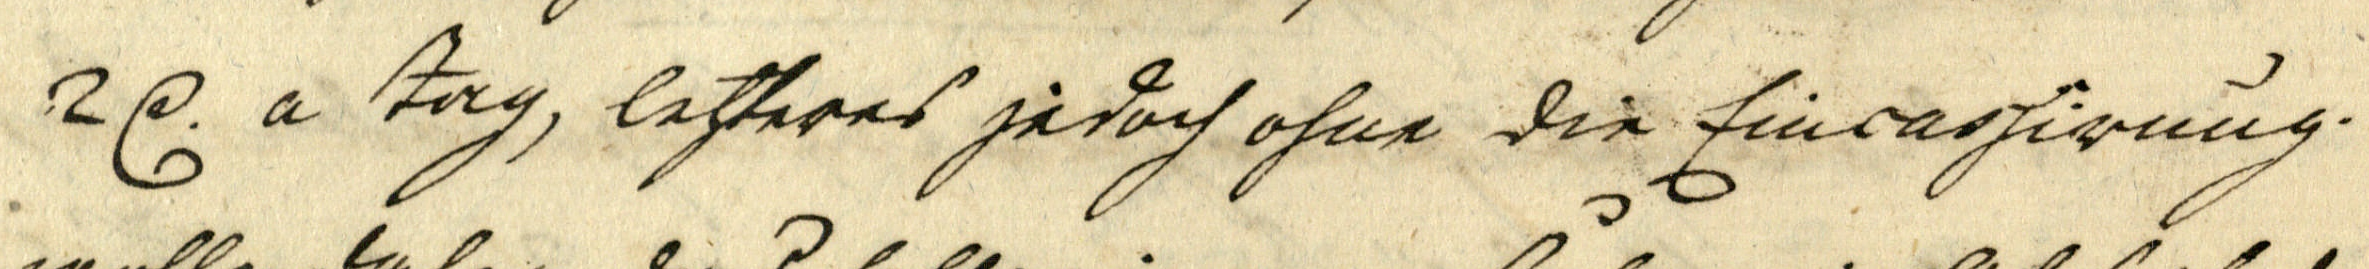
2 l. a Tag, letzteres jedoch ohne die Eincassirung.
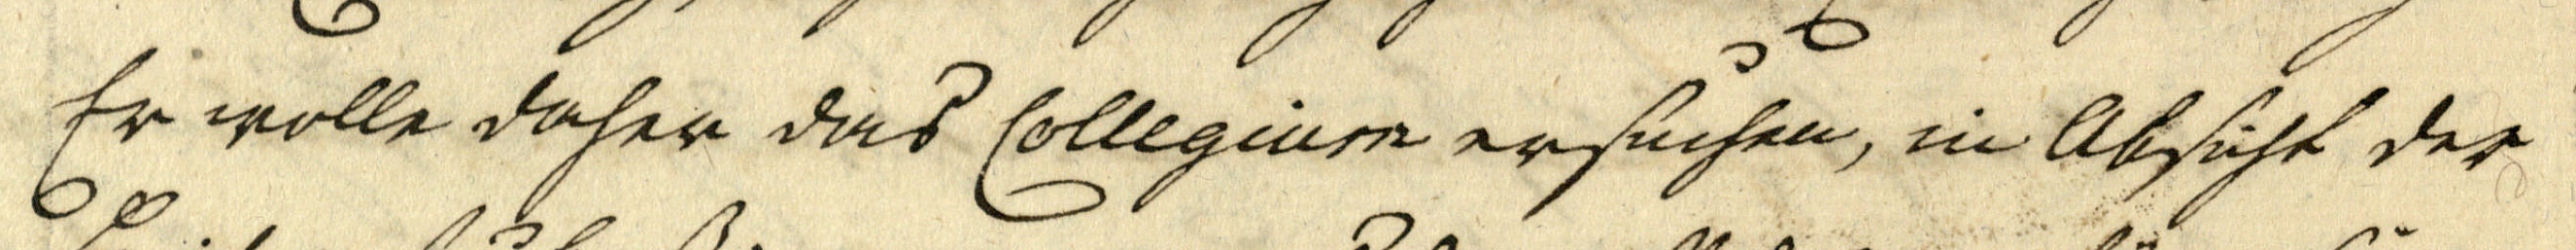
Er wolle daher das Collegium ersuchen, in Absicht der
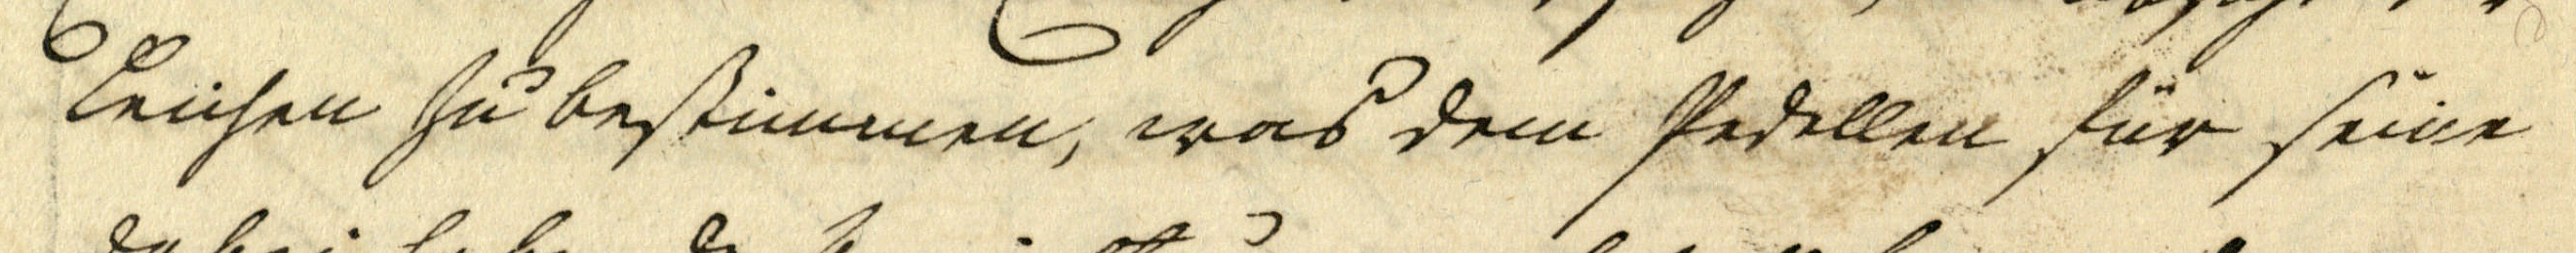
Leichen zu bestimmen, was dem Pedellen für seine
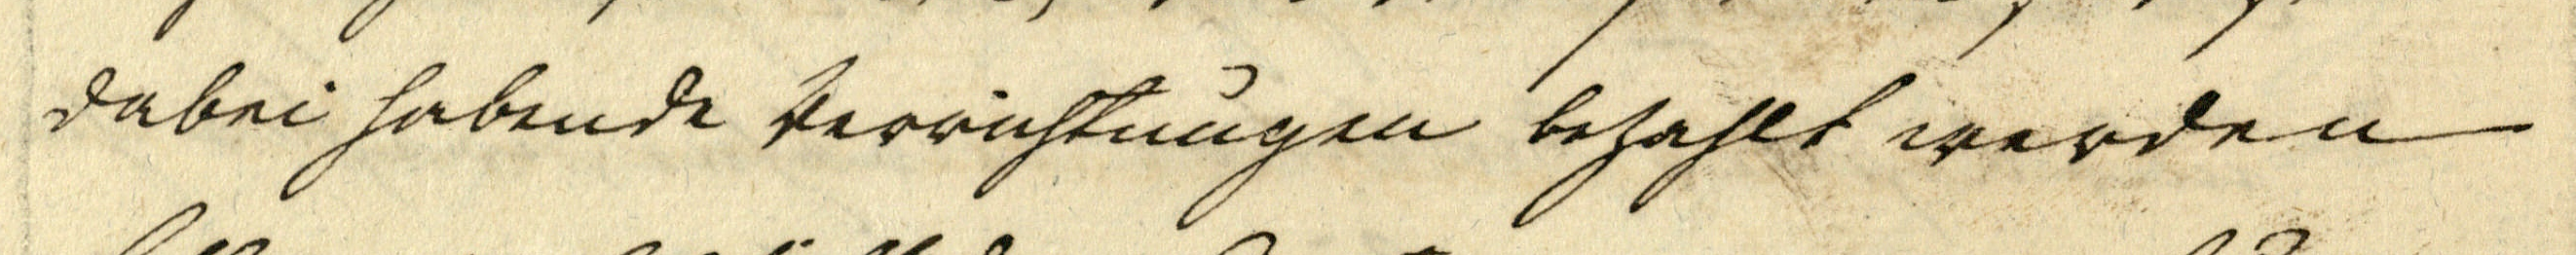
dabei habende Verrichtungen bezahlt werden
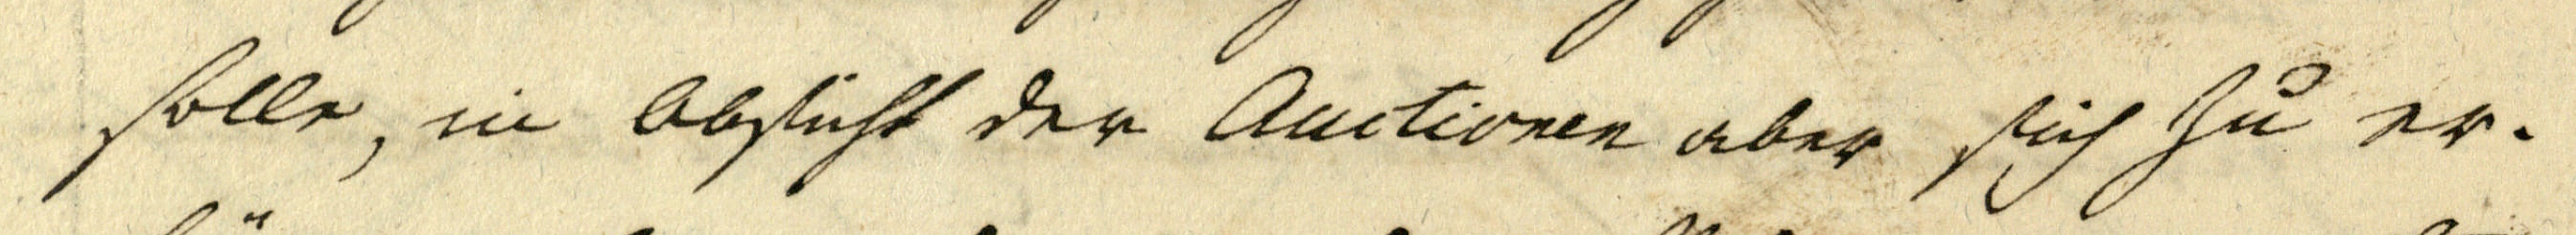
solle, in Absicht der Auctionen aber sich zu er¬
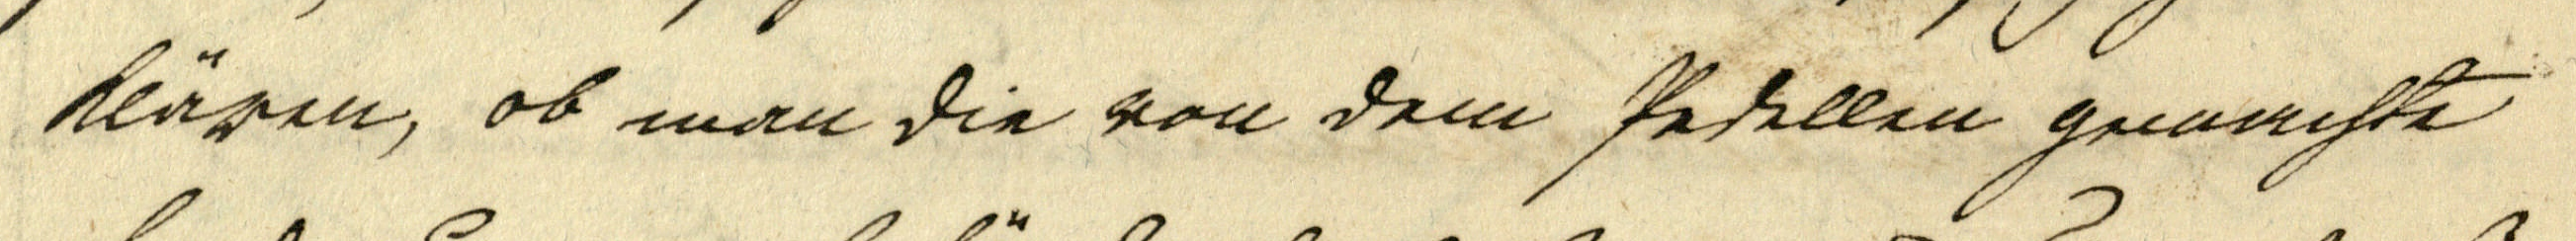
klären, ob man die von dem Pedellen gemachte
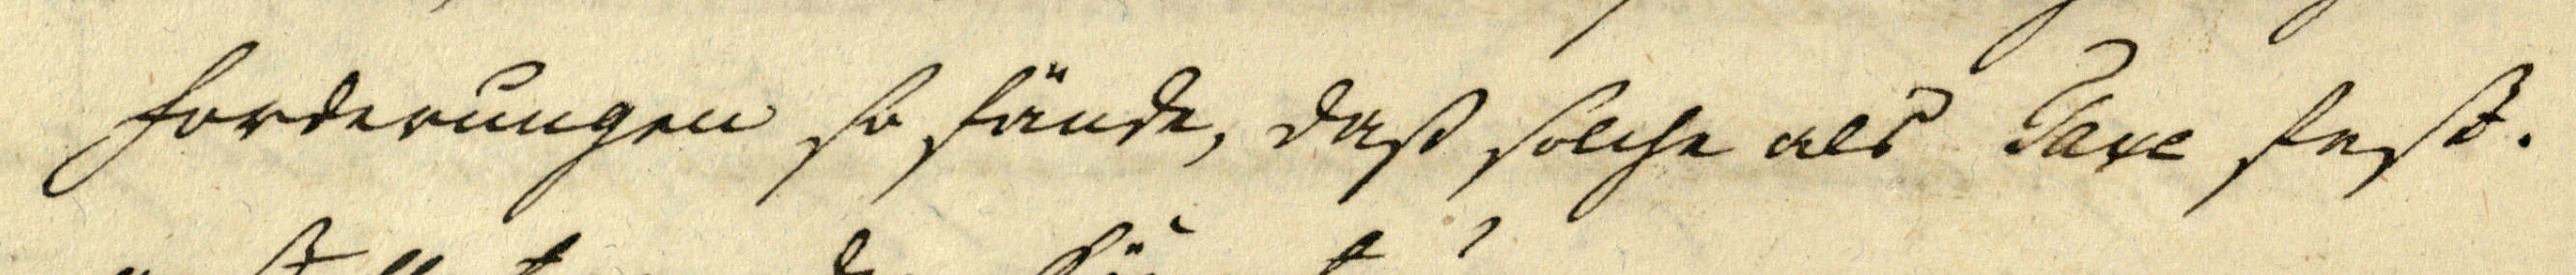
Forderungen so fände, daß solche als Taxe fest¬
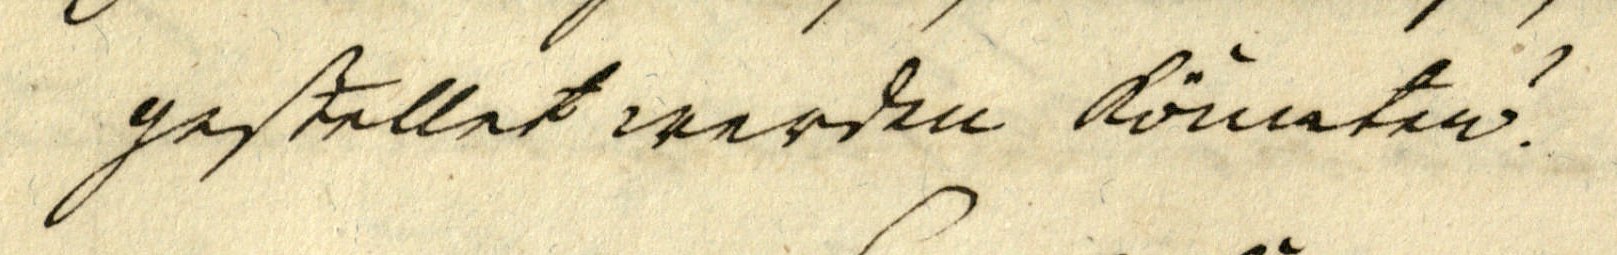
gestellet werden könnten?
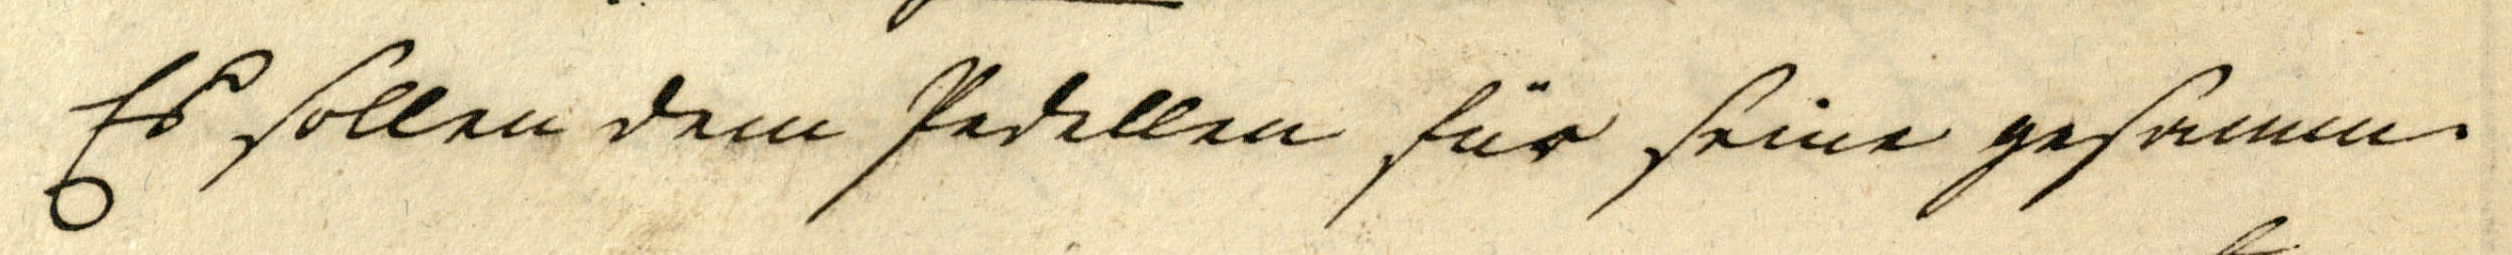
Es sollen dem Pedellen für seine gesamm¬
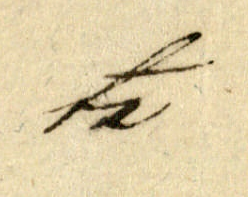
te
